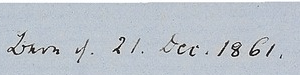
Bern d. 21. Dec. 1861.
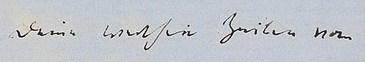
Deine werthen Zeilen vom
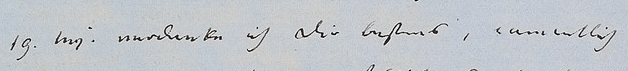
19. huj. verdanke ich Dir bestens, namentlich
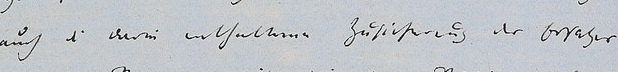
auch die darin enthaltene Zusicherung des Ersatzes
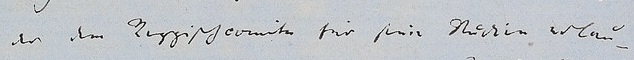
der dem Reppischcomite für seine Studien erlau-
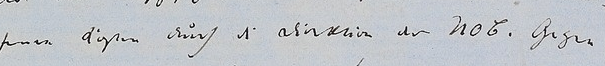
fenen Kosten durch die Direktion der NOB. Gegen
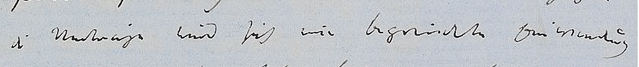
die Verträge wird sich eine begründete Einwendung
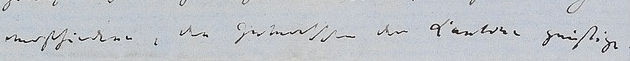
verschiedene, den Interessen der Kantone günstige
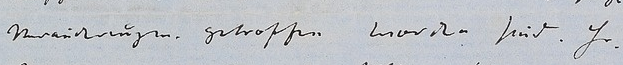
Veränderungen getroffen worden sind. Hr.
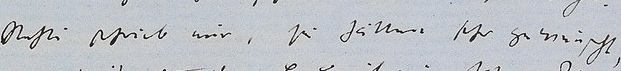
Stehli schrieb mir, sie hätten sehr gewünscht,
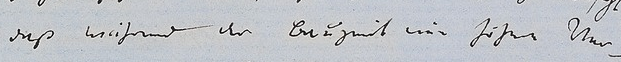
daß während der Bauzeit eine höhere Ver-
